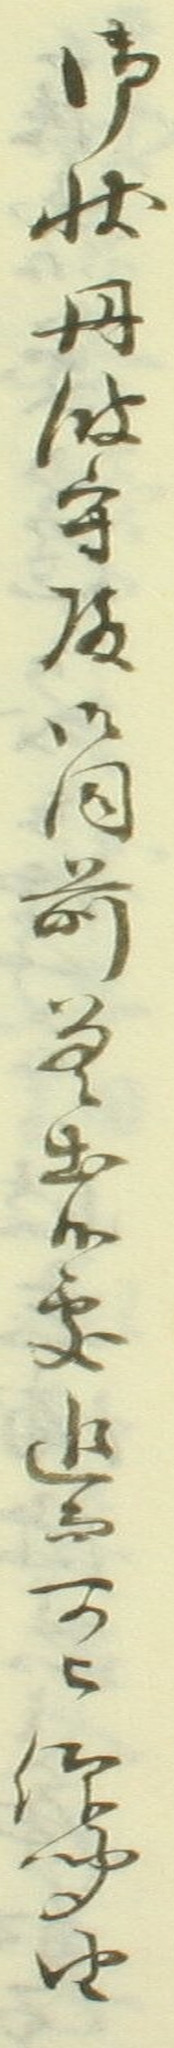御状丹波守殿御同前差出候処追而可被仰聞由
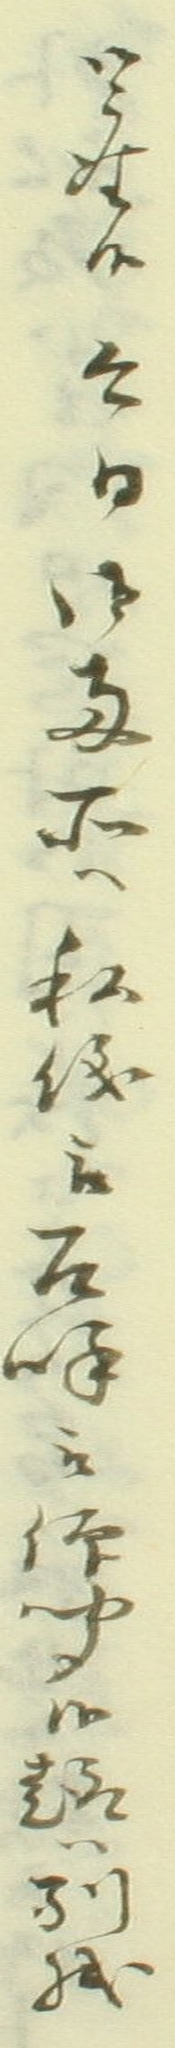御座候今日御両所へ私儀被召呼被仰聞候趣は別紙
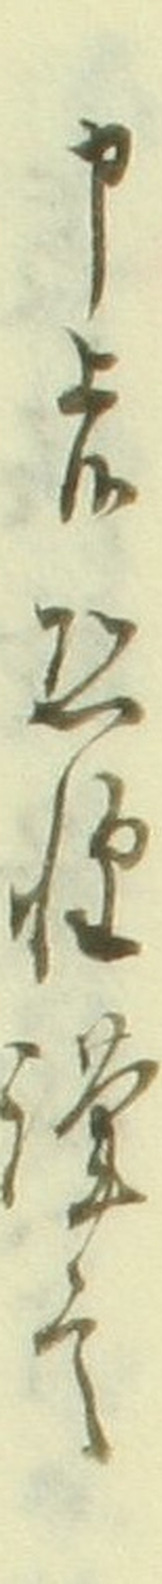申上候恐惶謹言
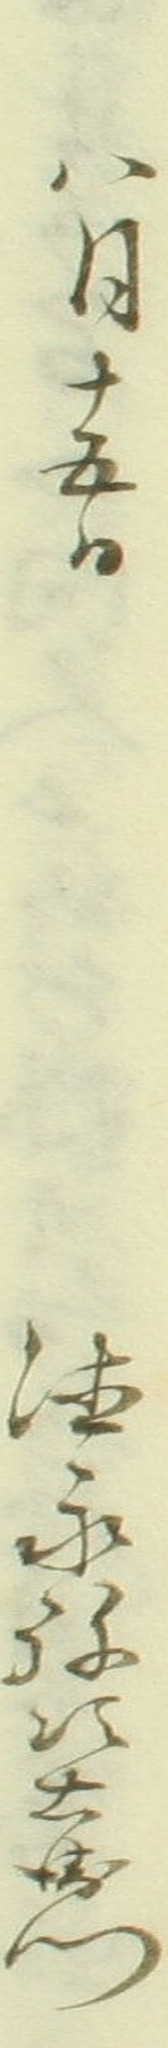八月十五日徳永弥次右衛門
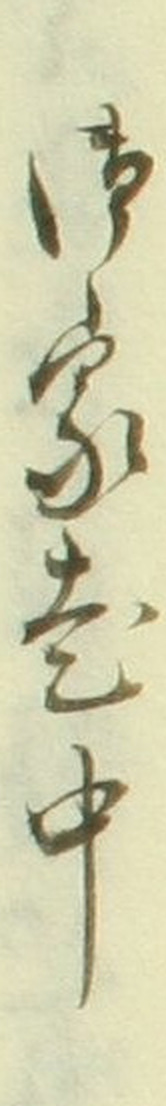御家老中
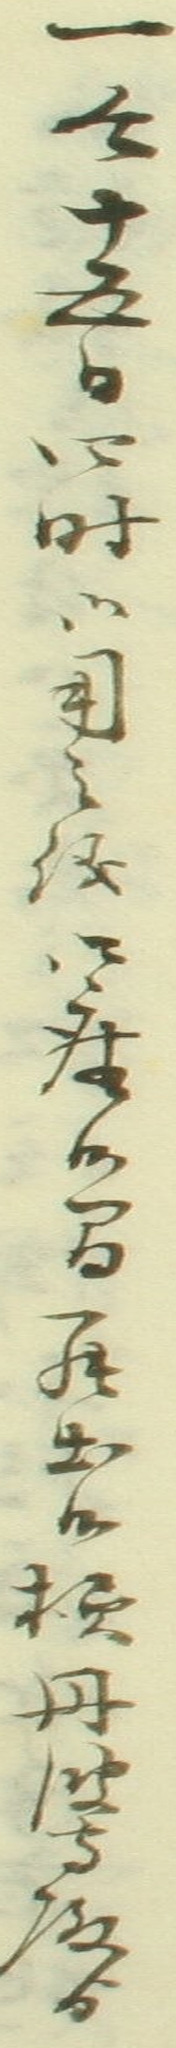一今十五日四時御用之儀御座候間罷出候様丹波守ゟ
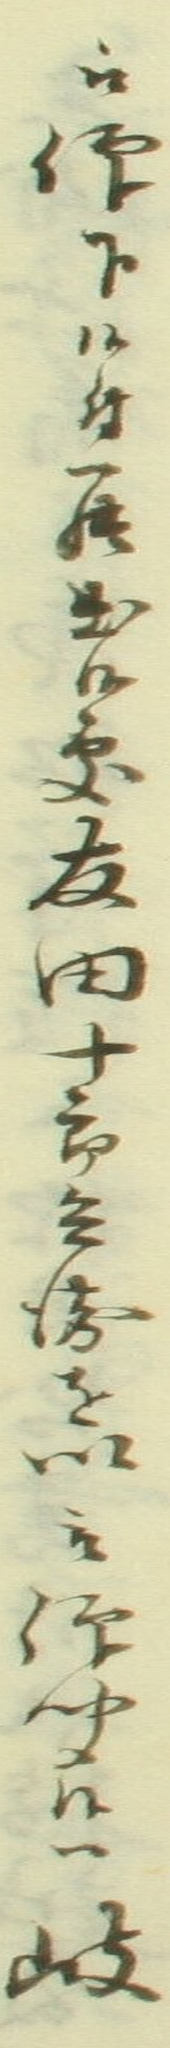被仰下候付罷出候処友田十郎兵衛を以被仰聞候は岐

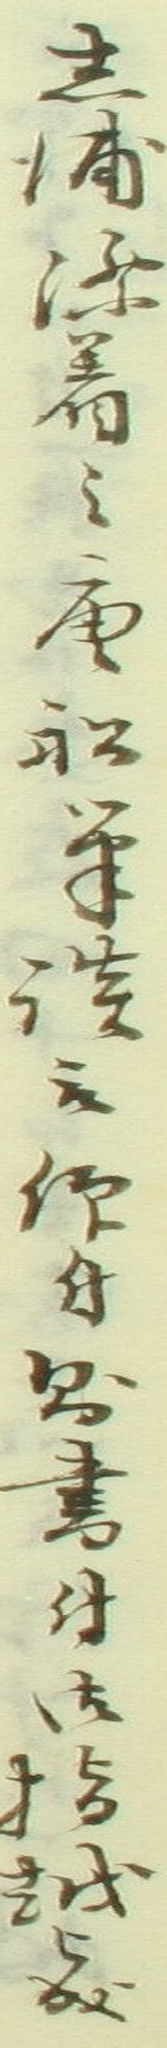志浦漂着之唐船筆談被仰付則書付御指越被成
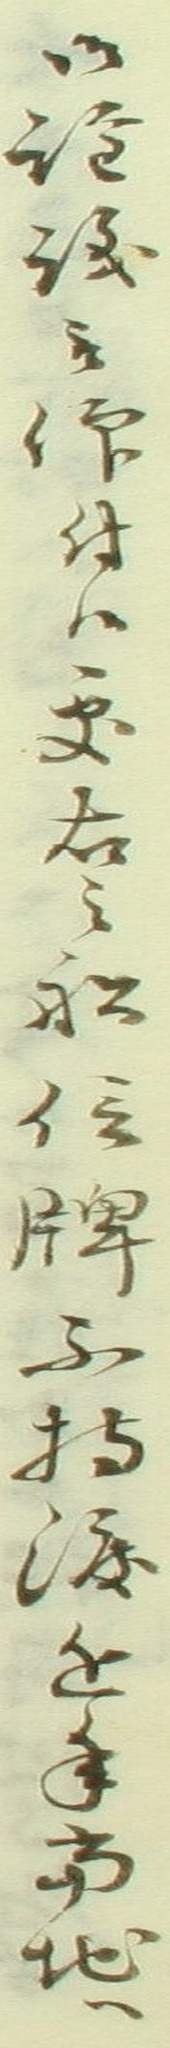御詮議被仰付候処右之船信牌不持渡近年当地へ
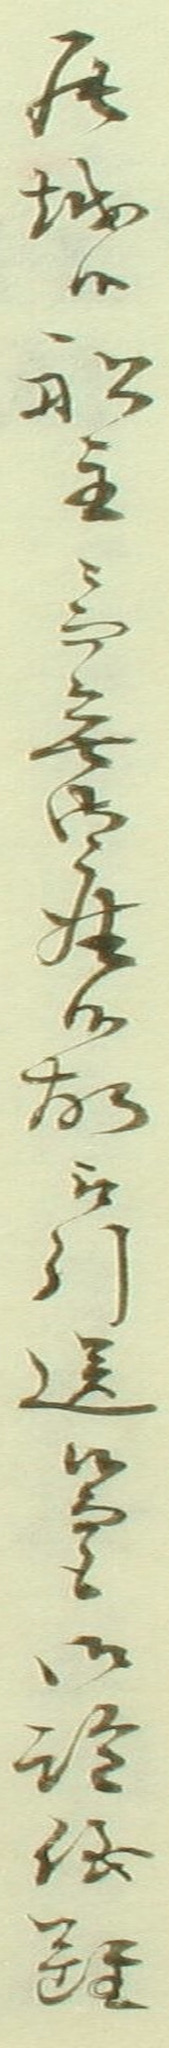罷越候船主に而無御座候故引送候而御詮議難
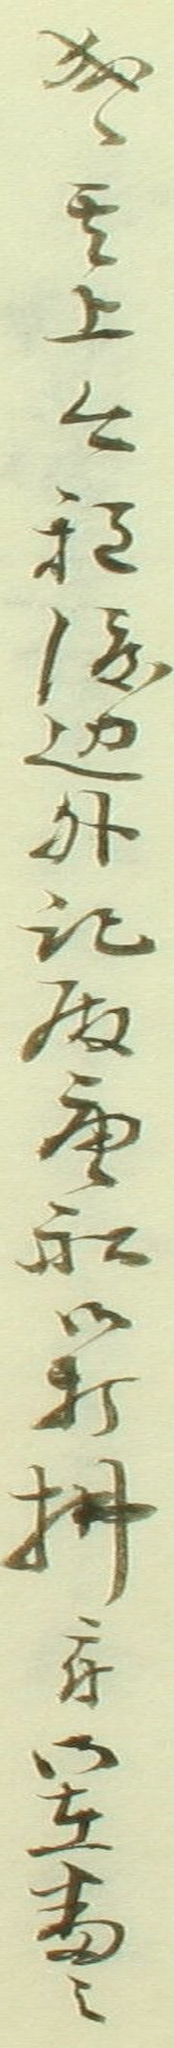義候其上今程渡辺外記殿唐船御打払に付御在番之
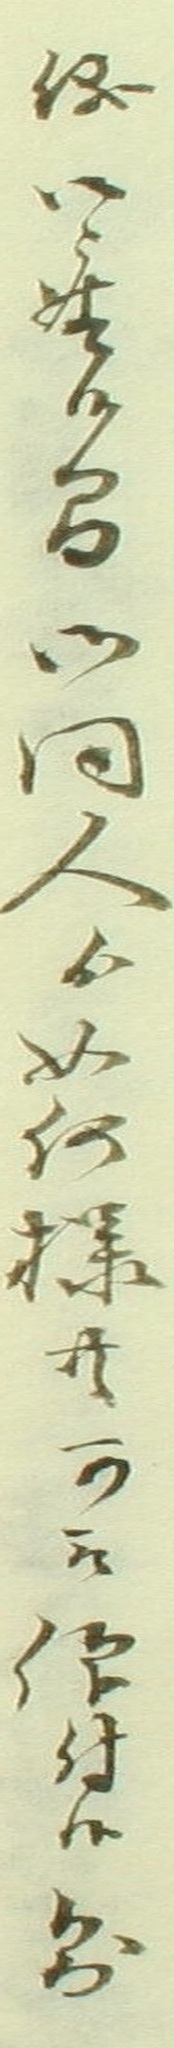儀御座候間御同人ゟ如何様共可被仰付候則
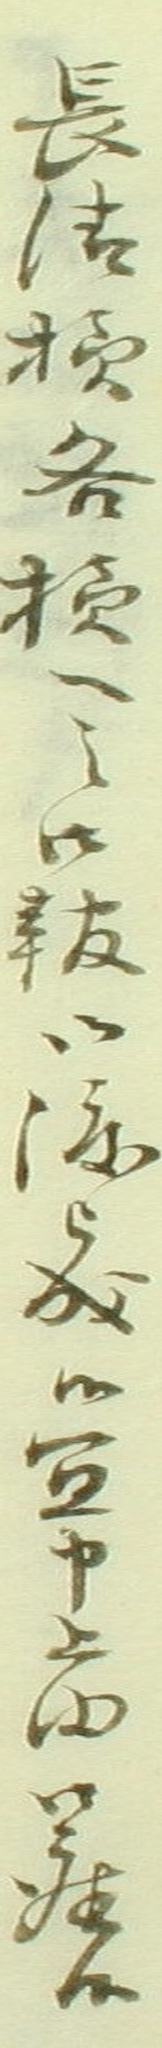長清様各様へ之御報御渡被成候宜申上由御座候
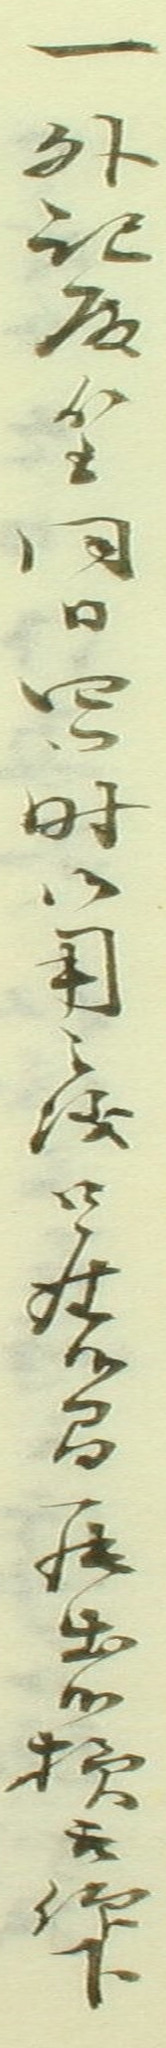一外記殿ゟも同日四つ時御用之儀御座候間罷出候様被仰下
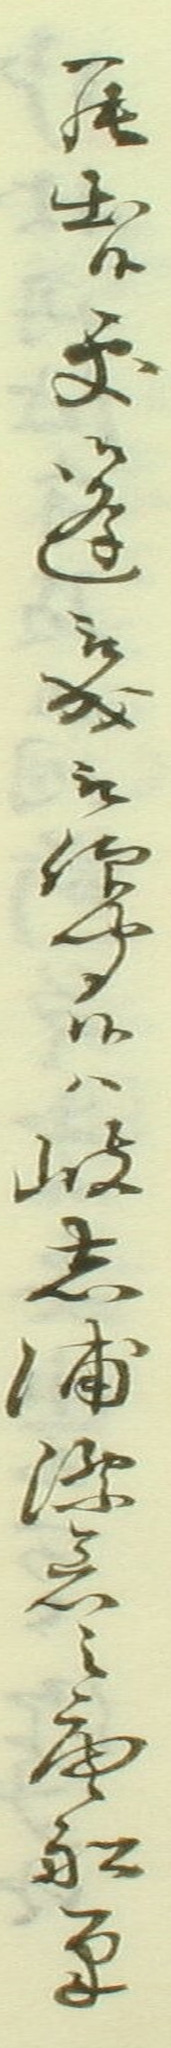罷出候処御逢被成被仰聞候は岐志浦漂着之唐船筆
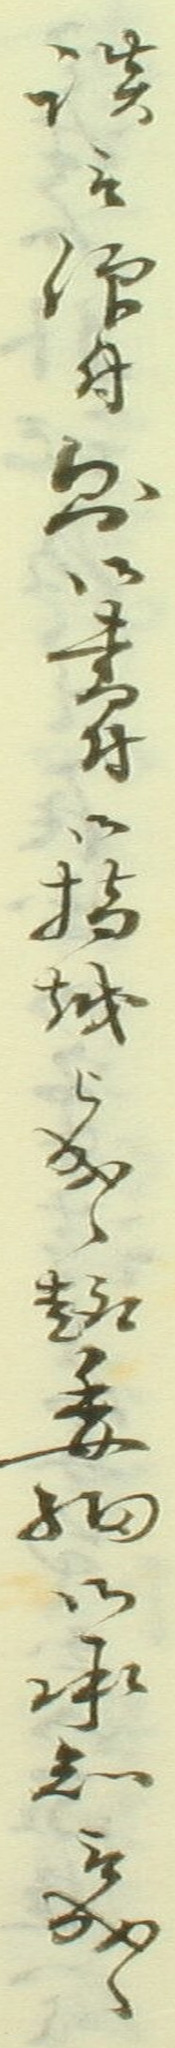談被仰付則御書付御指越被成候趣委細御承知被成候
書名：異国船漂着記
